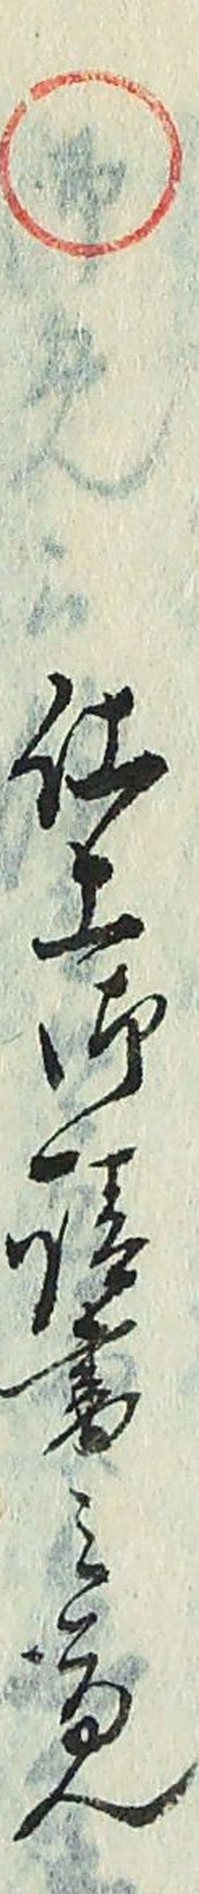○仕上御請諸之覚
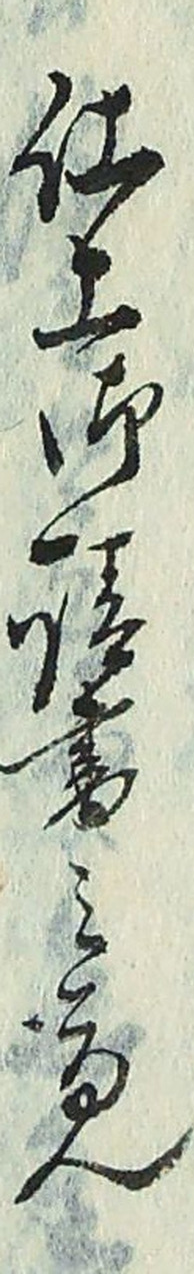○仕上御請諸之覚
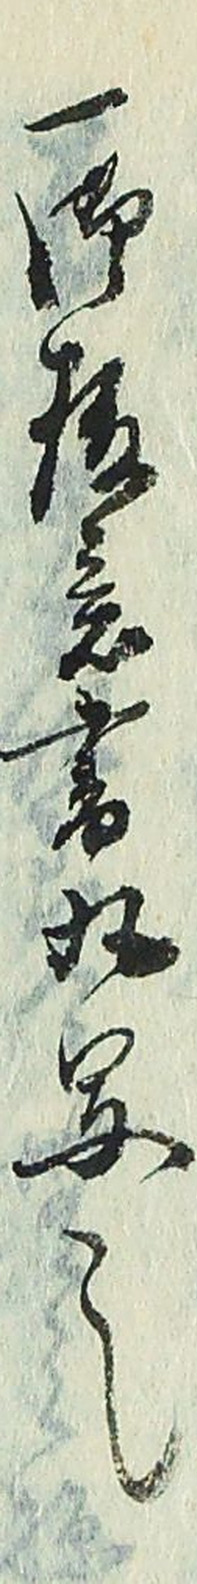一御趣意書丸写し
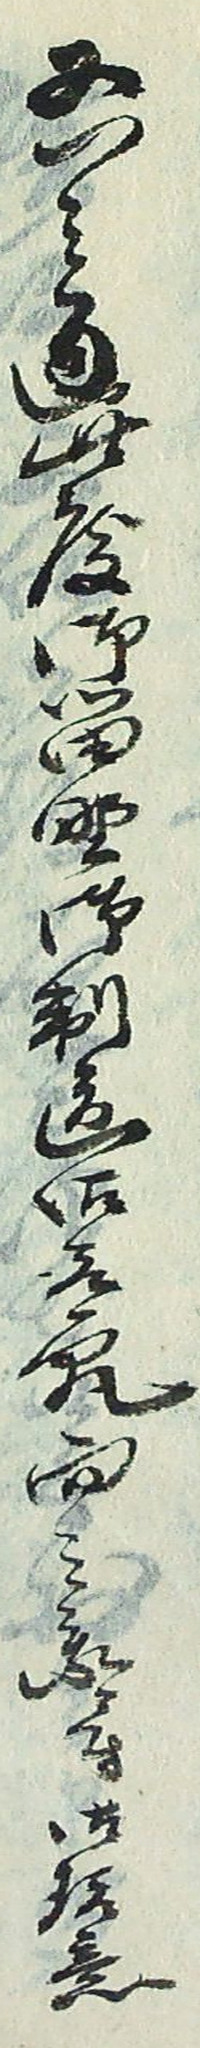右之通此度御留野御制道御取究向之義ニ付御趣意
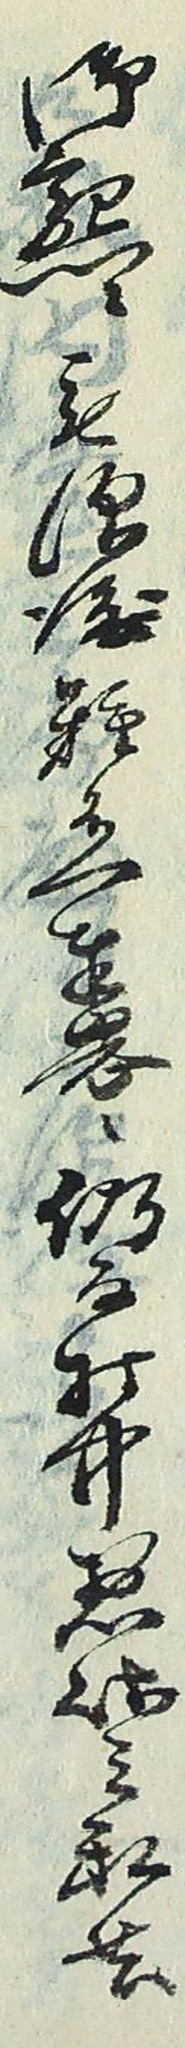御懇ニ被仰渡難有奉畏候仍而村中惣代之私共
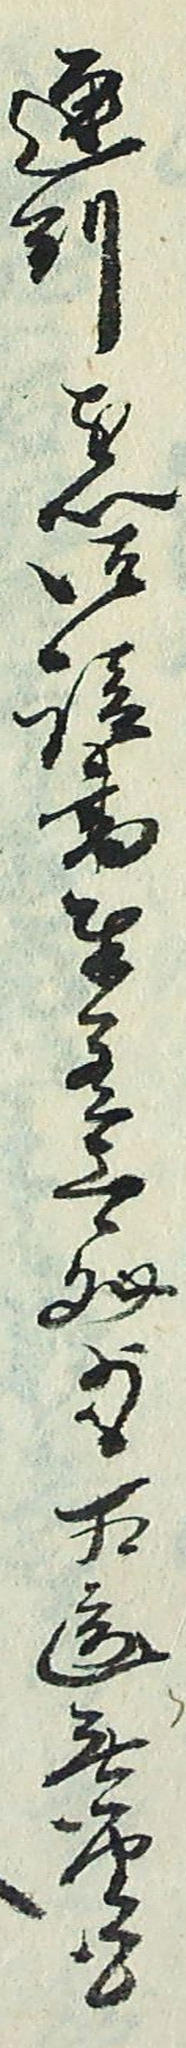連判を以御請書奉差上候処少も相違無御坐候以上
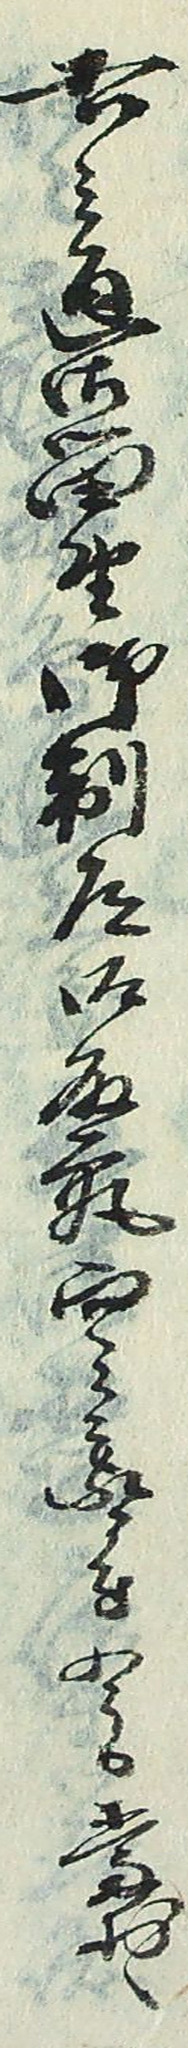右之通御留野御制道御取究向之義ニ付今日當村へ
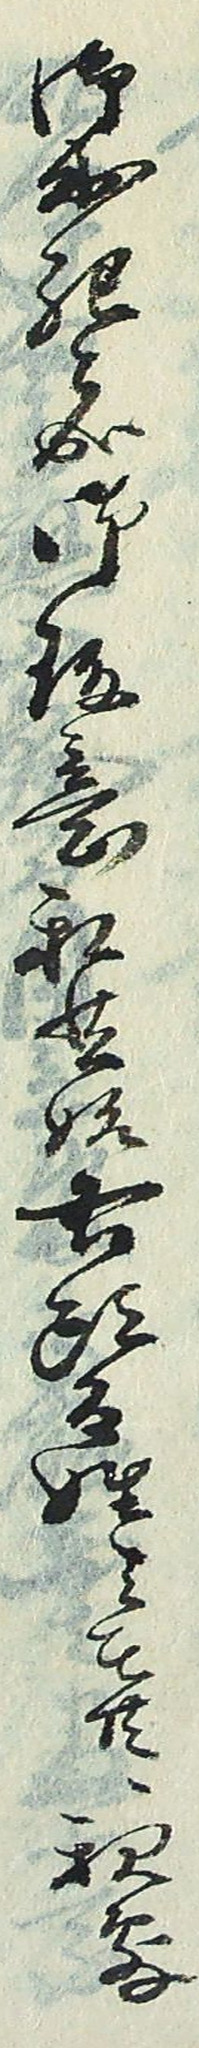御出張被成御趣意私共始右頭百姓之者共へ親敷
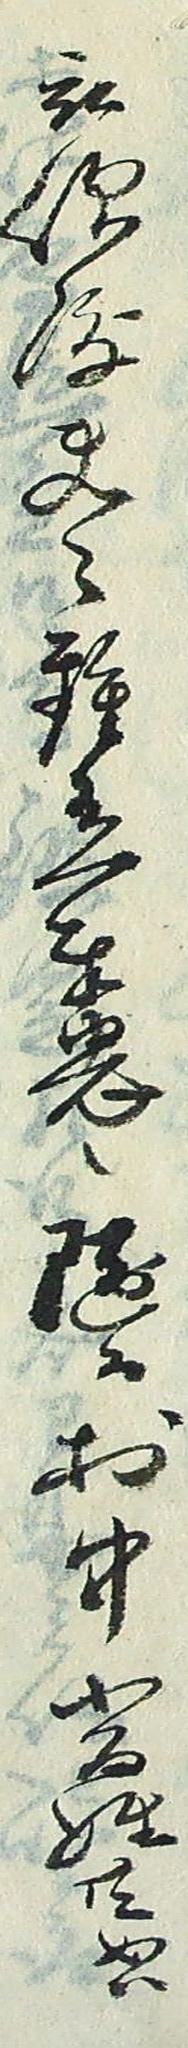被仰渡夫々難有奉畏候随而村中小百姓共義ハ
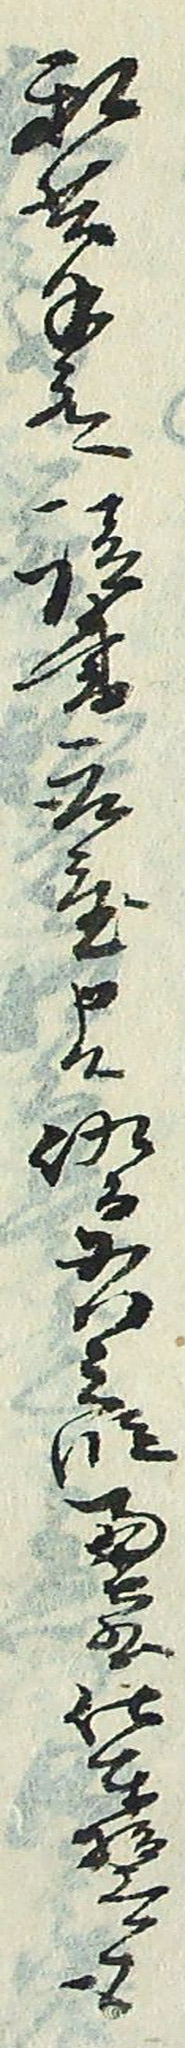私共手元へ請書取置申候仍而右之段奥書仕奉指上候以上
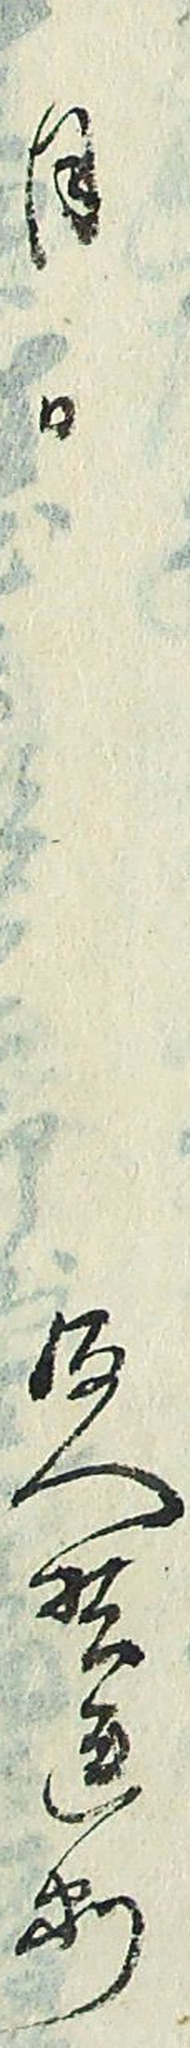月日役人共連判

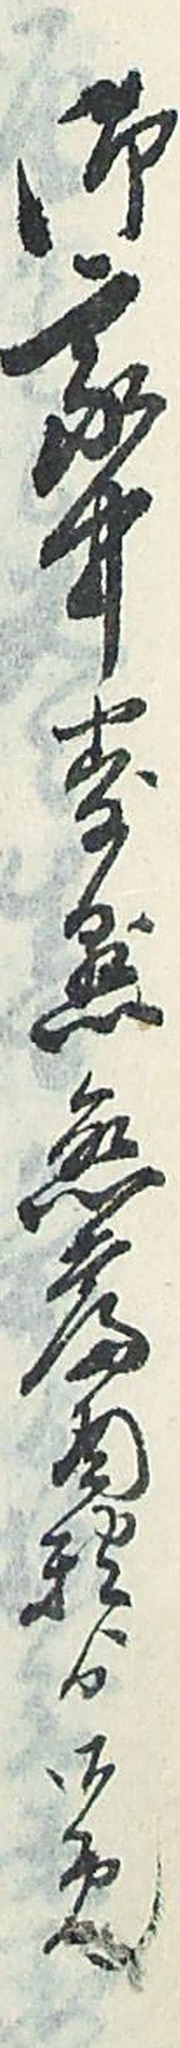御家中歩懸愈當酉秋ゟ御免
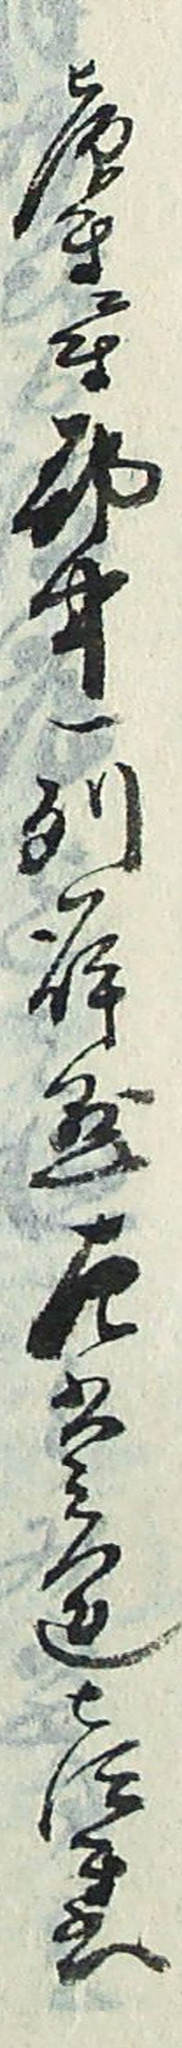被仰付ニ付郡中一列解懸左書之運被仰付書
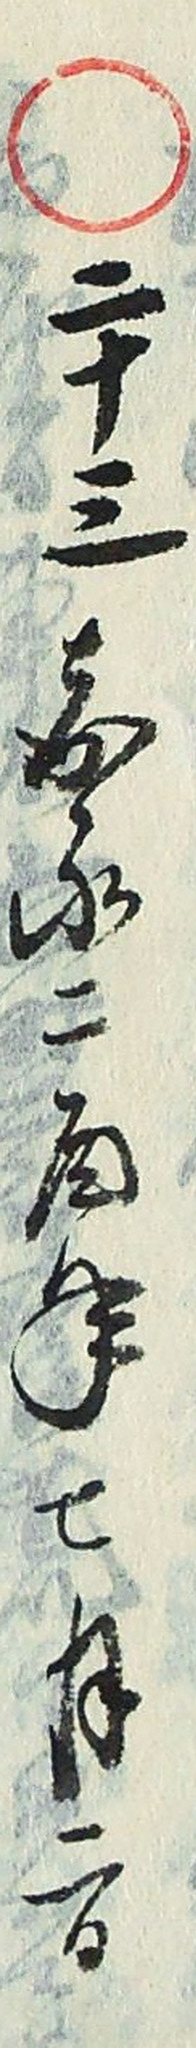○二十三嘉永二酉年七月二日
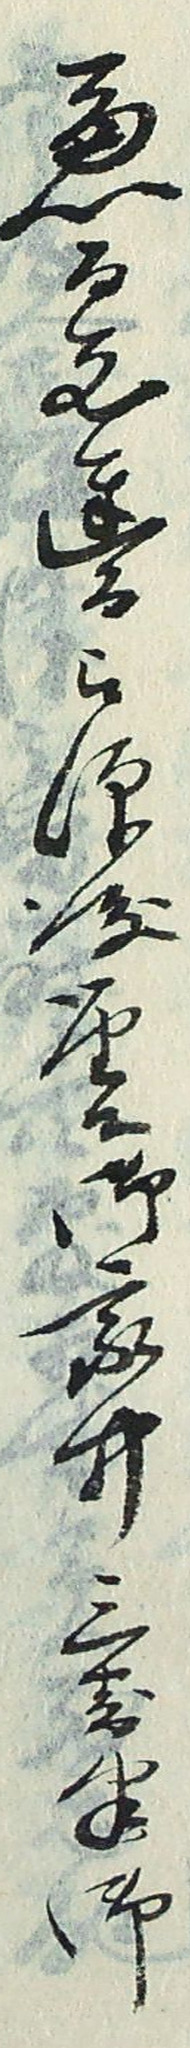兼而先達而被仰渡御坐候御家中三歩半御
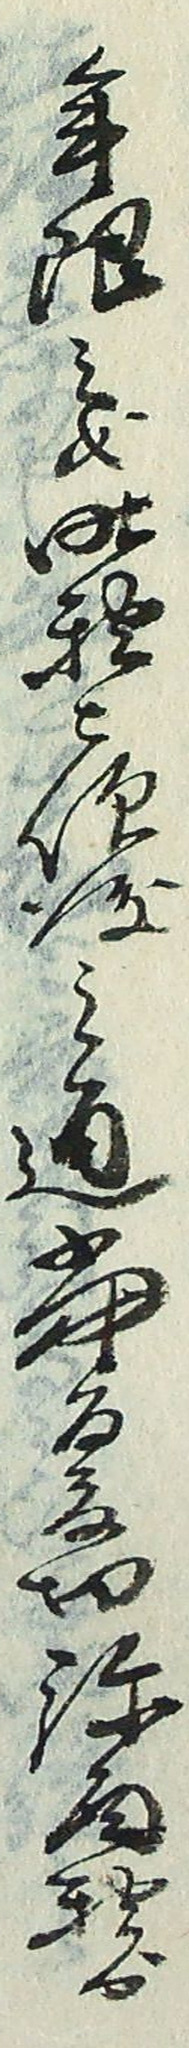年限之義昨秋被仰渡之通當酉夏切弥酉秋ゟ
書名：諸御趣意書并御下知向之写
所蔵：鳴門教育大学 Naruto University of Education
